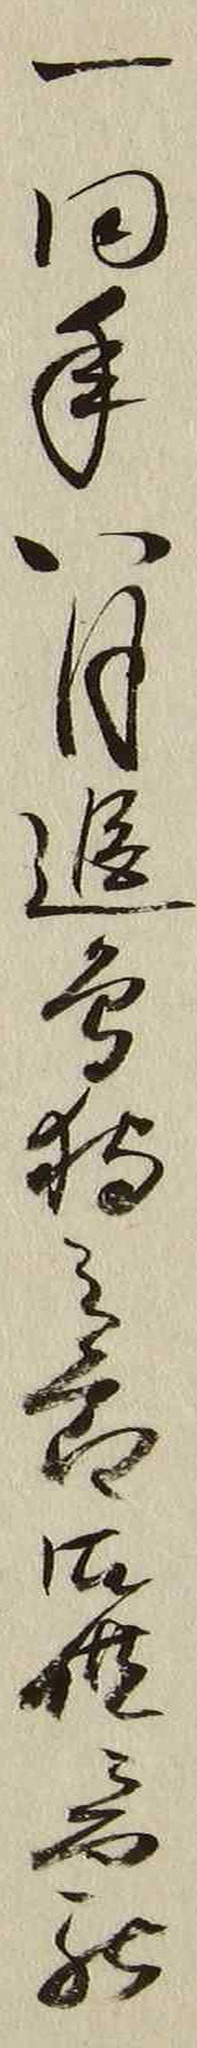一同年八月追鳥狩之節御供ニ而罷
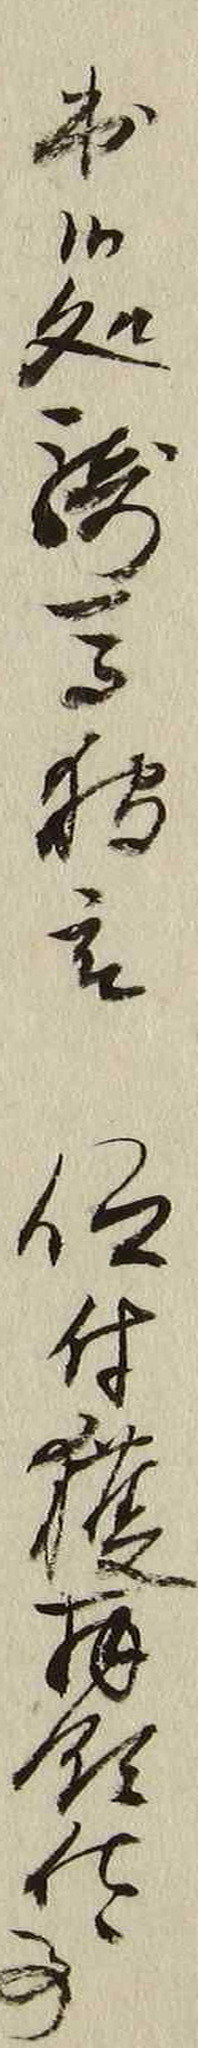出候処騎馬狩被仰付獲拝領仕候事
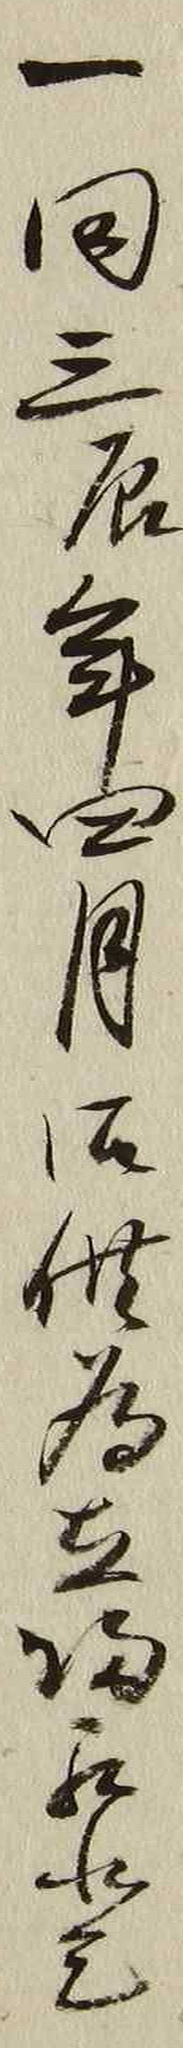一同三辰年四月御供為立帰罷登
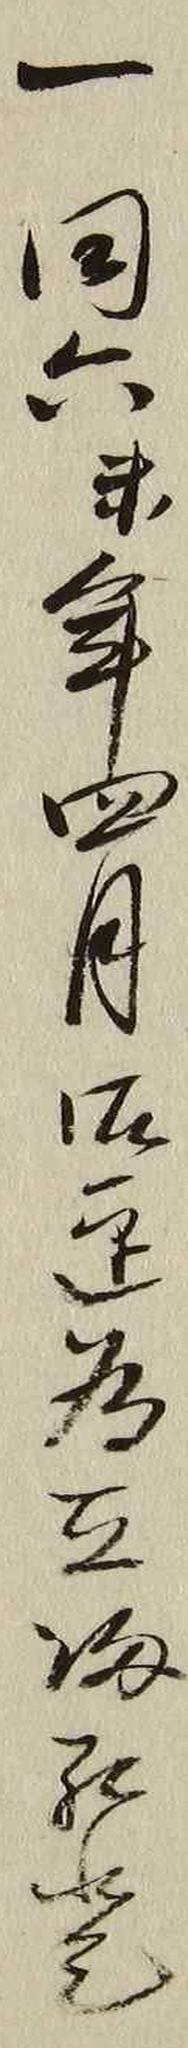一同六未年四月御迎為立帰罷登
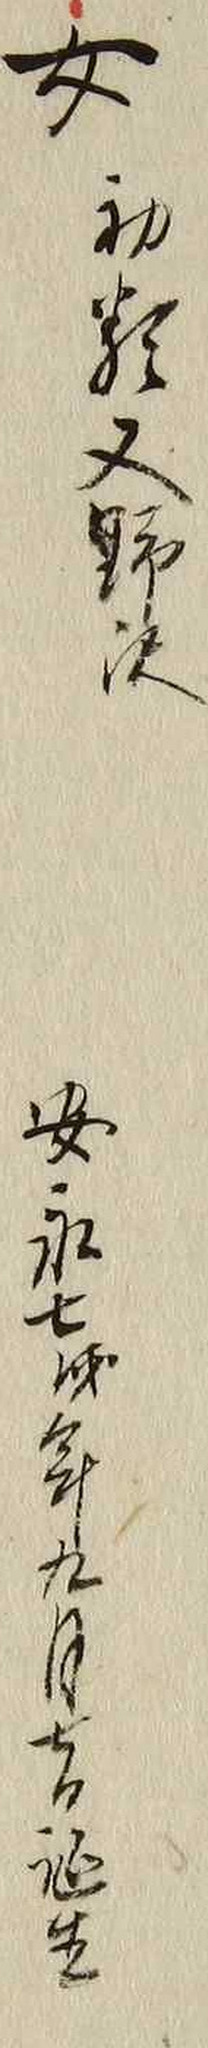女初類又野沢安永七戌年九月七日誕生
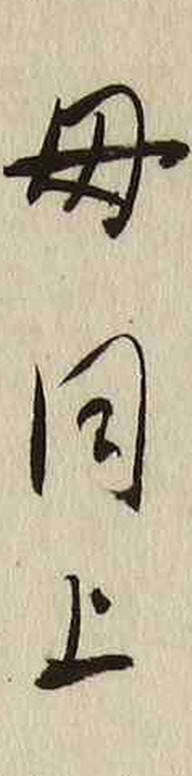母同上
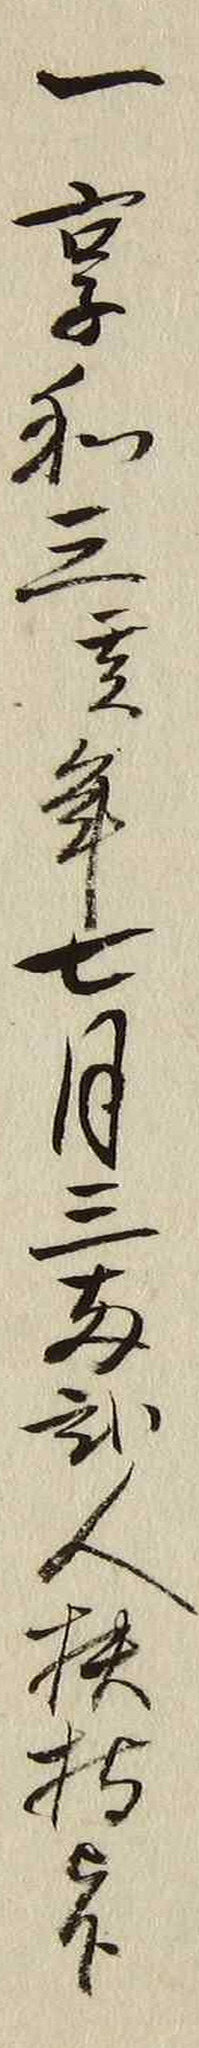一享和三亥年七月三両弐人扶持被下
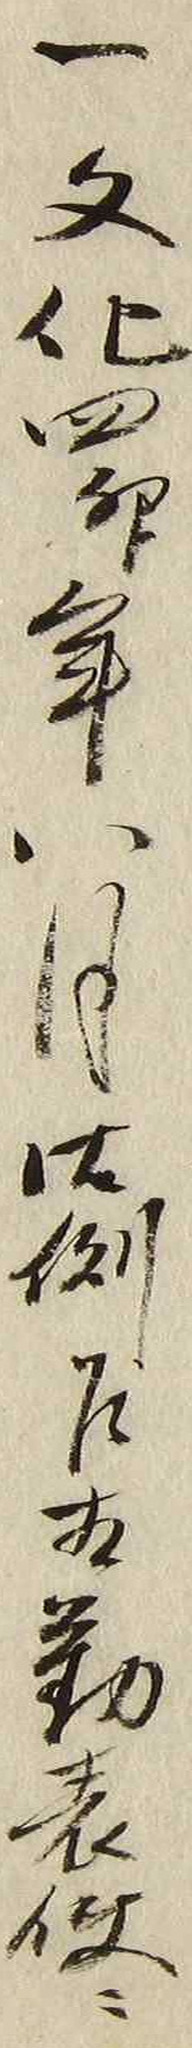一文化四卯年八月御側乍相勤表使ニ
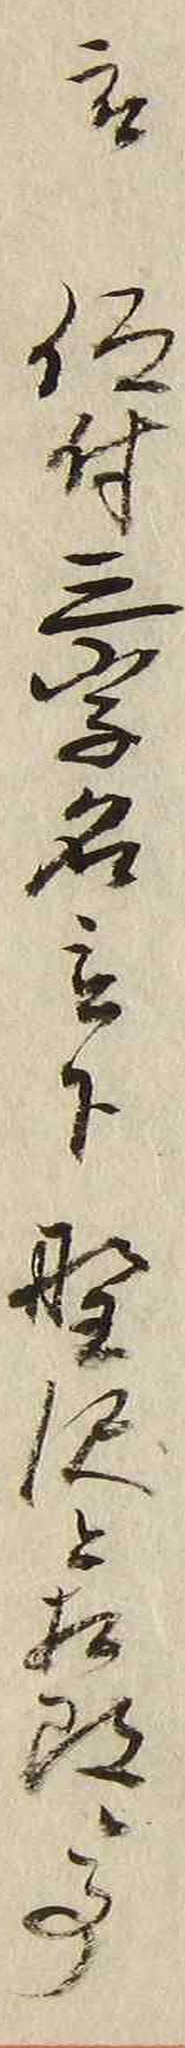被仰付三字名被下野沢と相改候事

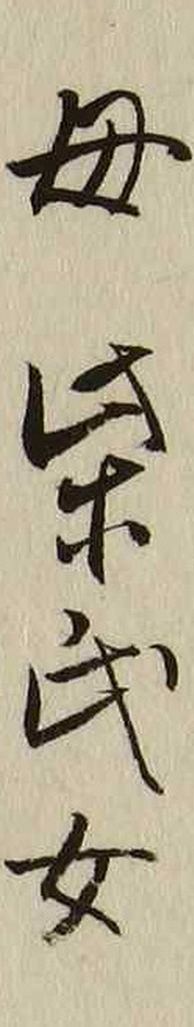母柴氏女
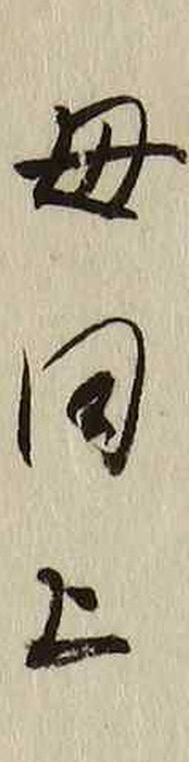母同上
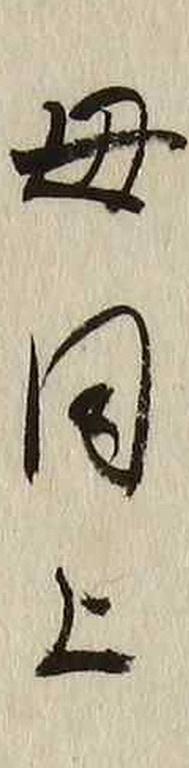母同上
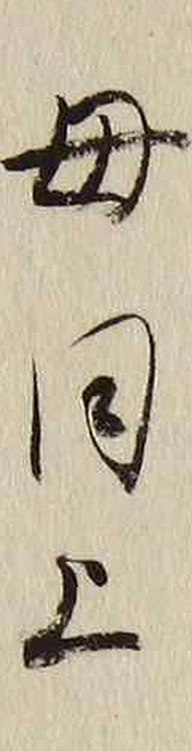母同上
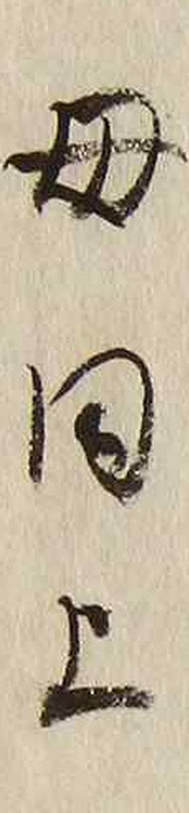母同上

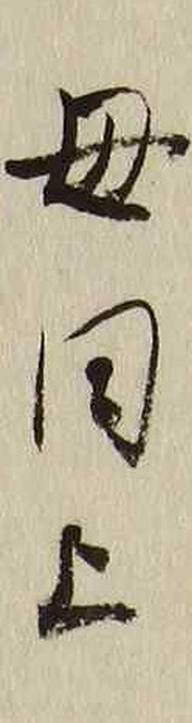母同上
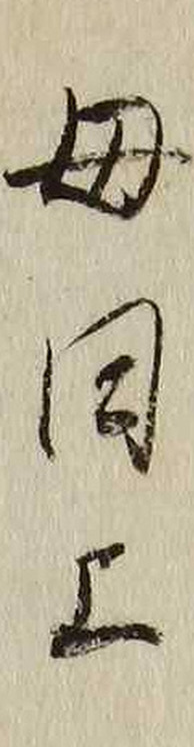母同上
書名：諸士系譜　巻之352　す之部2
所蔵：会津若松市立会津図書館
